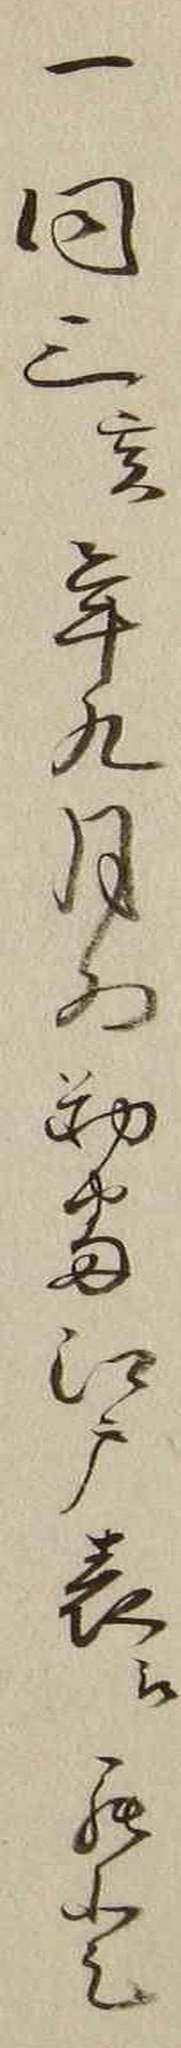一同三亥年九月為勤番江戸表江罷登
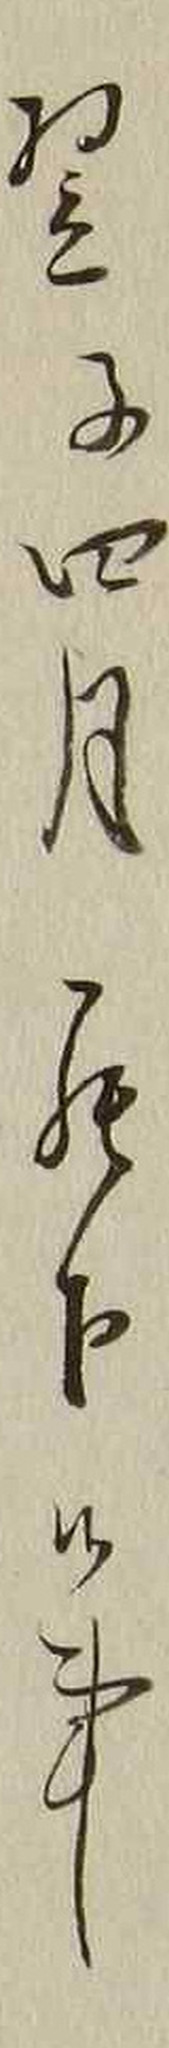翌子四月罷下候事
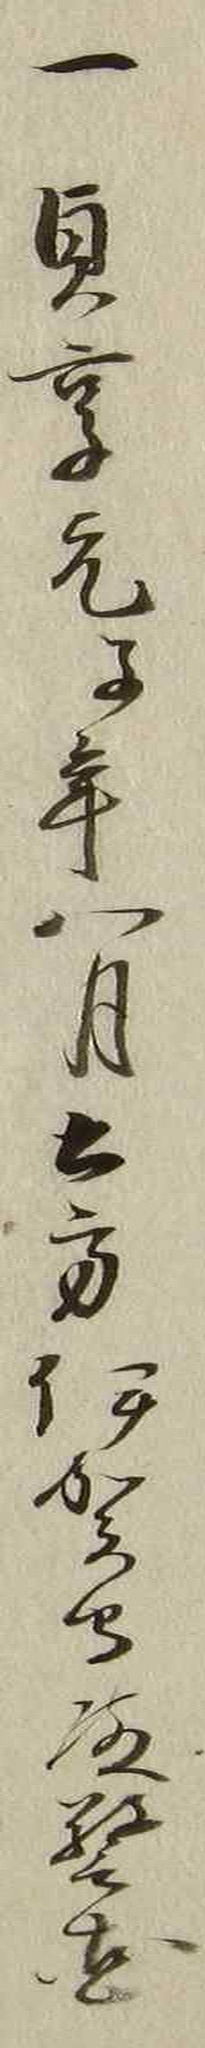一貞享元子年八月土方伊賀守殿警固
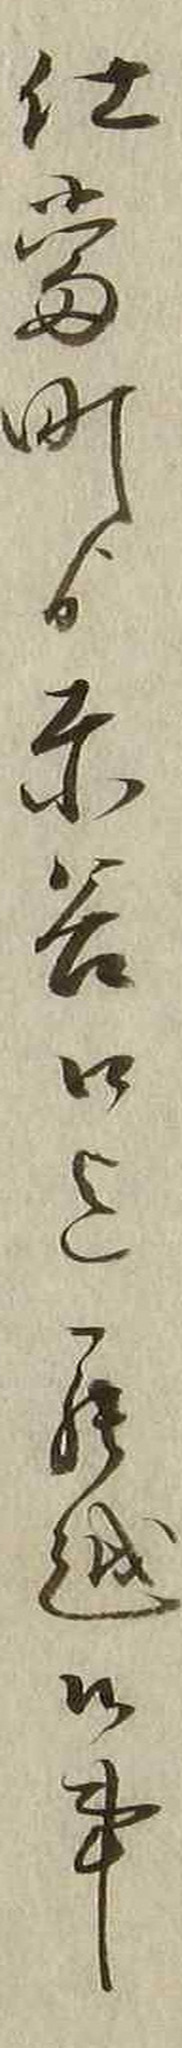仕当町ゟ赤谷口迄罷越候事
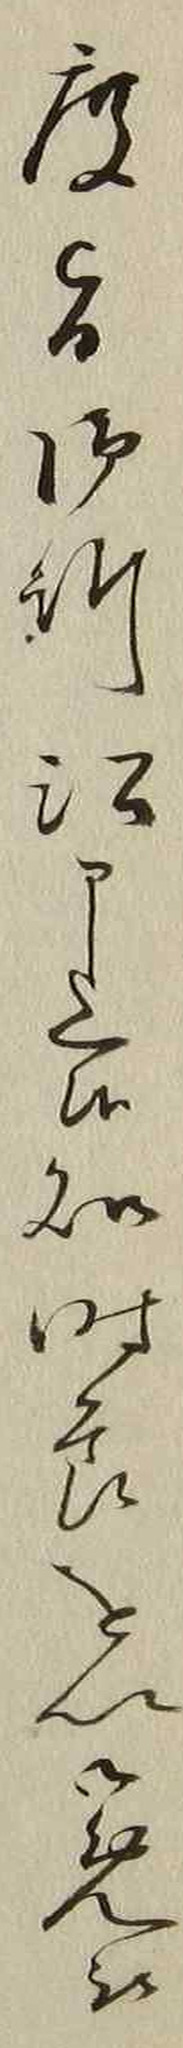度旨御訴訟申上候処時節を以御免被
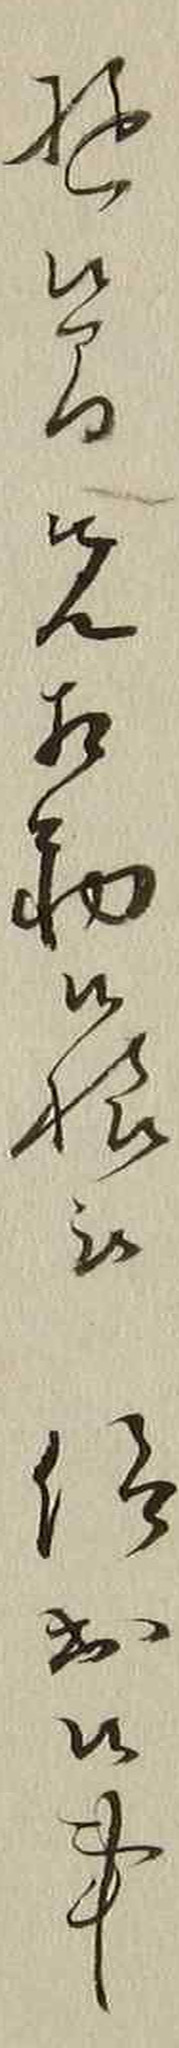遊候間先相勤候様被仰出候事
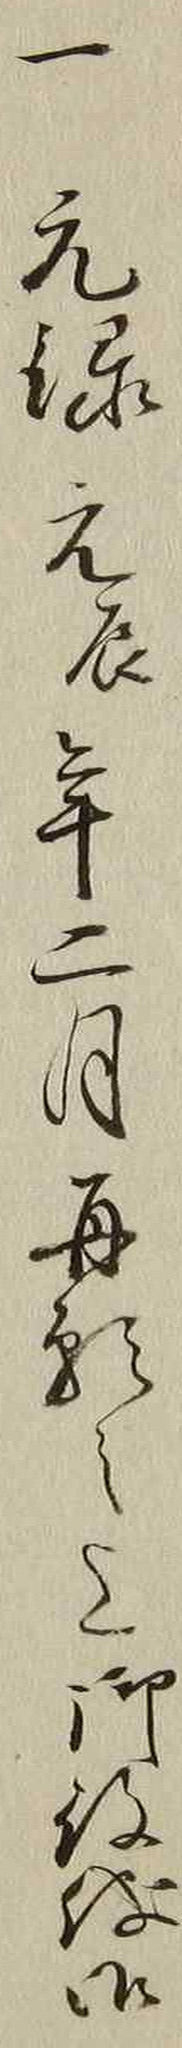一元禄元辰年二月再願之上御役儀御
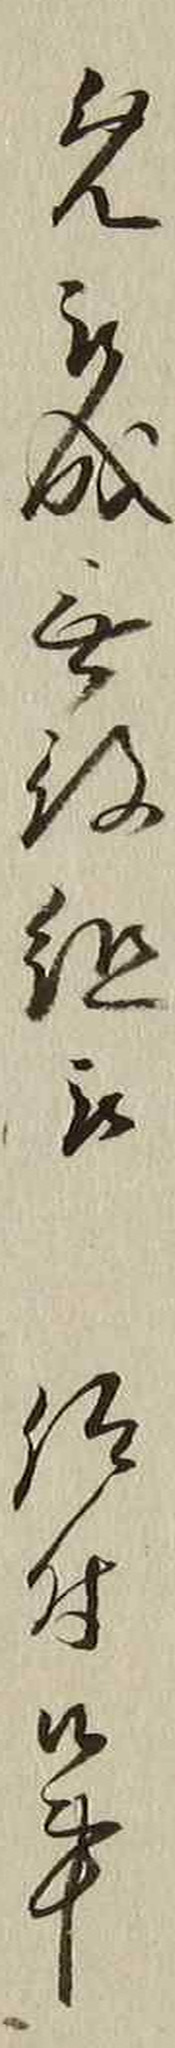免被成無役組被仰付候事
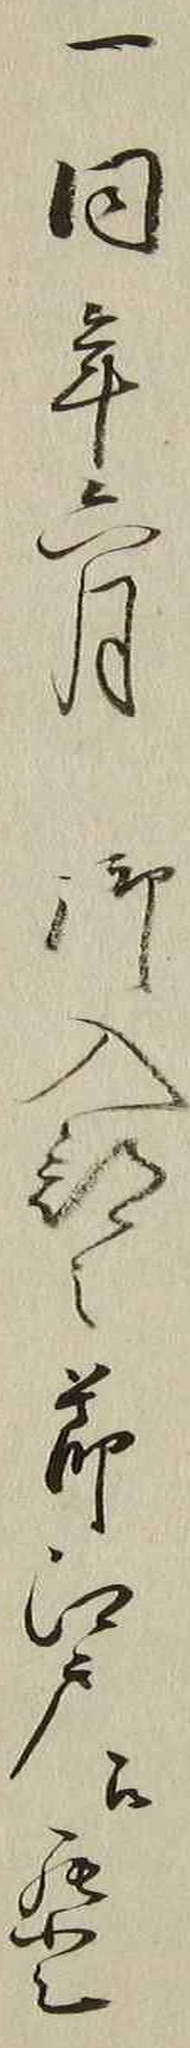一同年六月御入部之節江戸江罷登
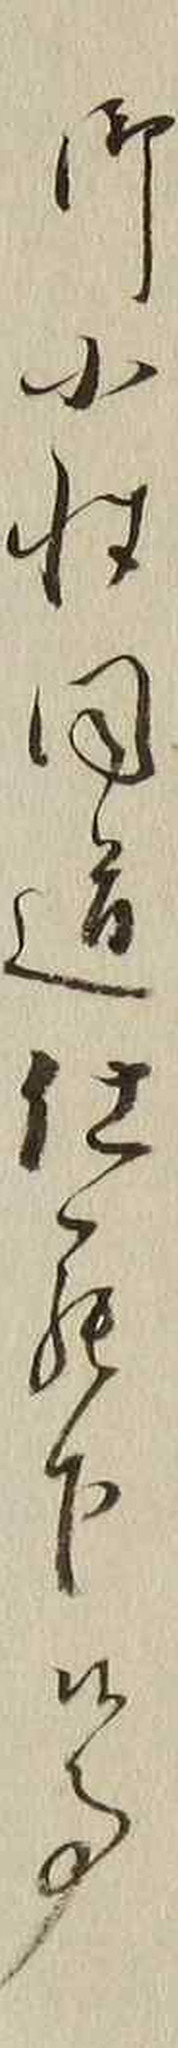御小性同道仕罷下候事
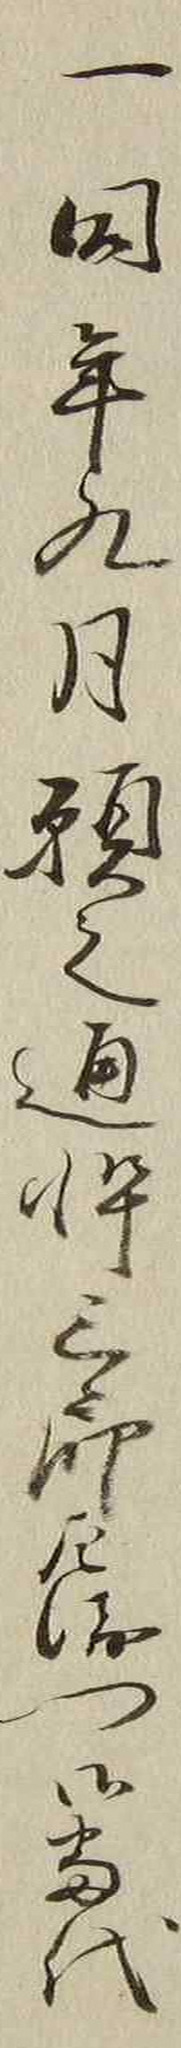一同年九月願之通忰三郎左衛門御番代
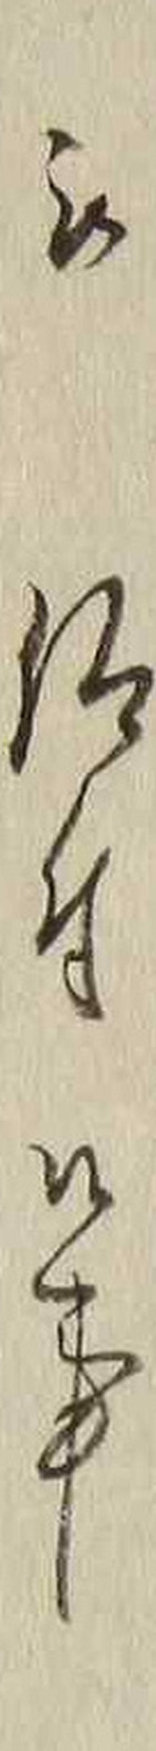被仰付候事
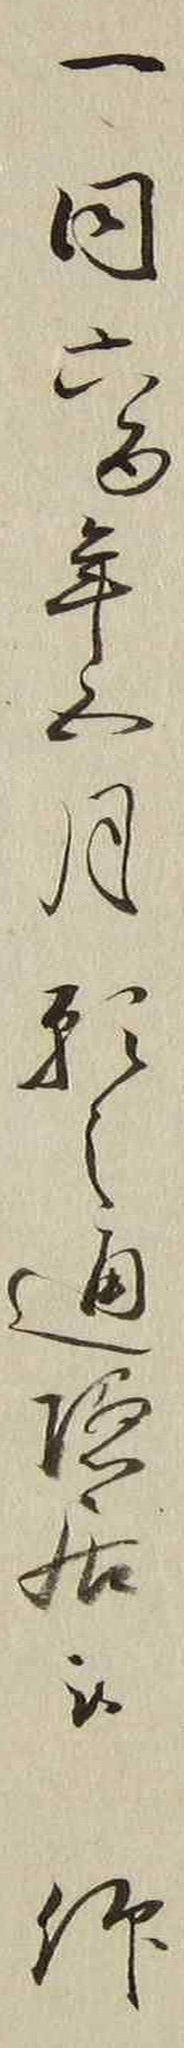一同六酉年五月願之通隠居被仰
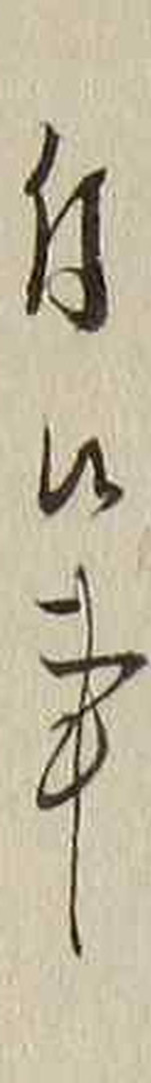付候事
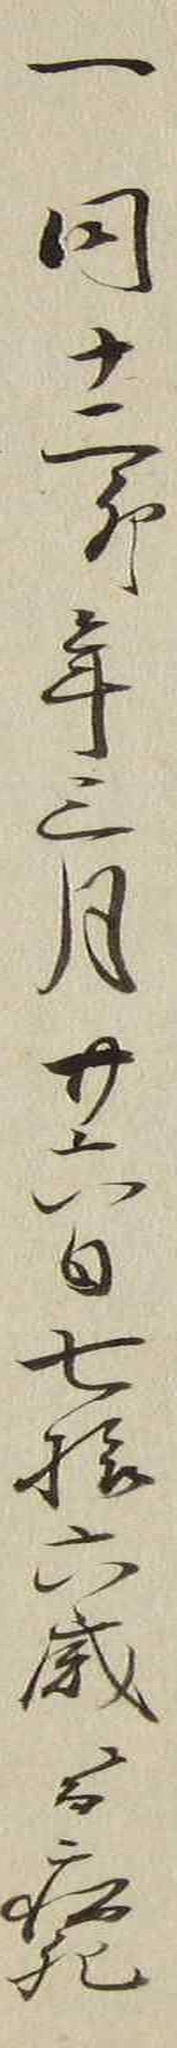一同十二卯年三月廿六日七拾六歳ニ而病死
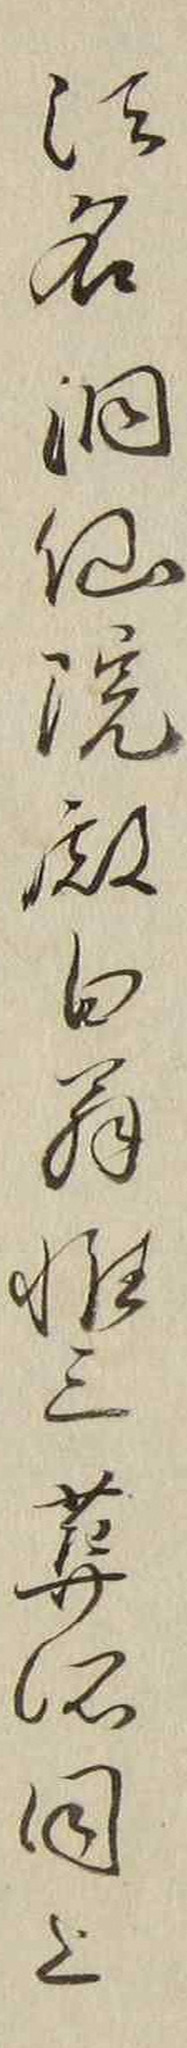法名洞仙院殿白翁惟三葬所同上
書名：諸士系譜　巻之25　い之部25
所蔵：会津若松市立会津図書館
